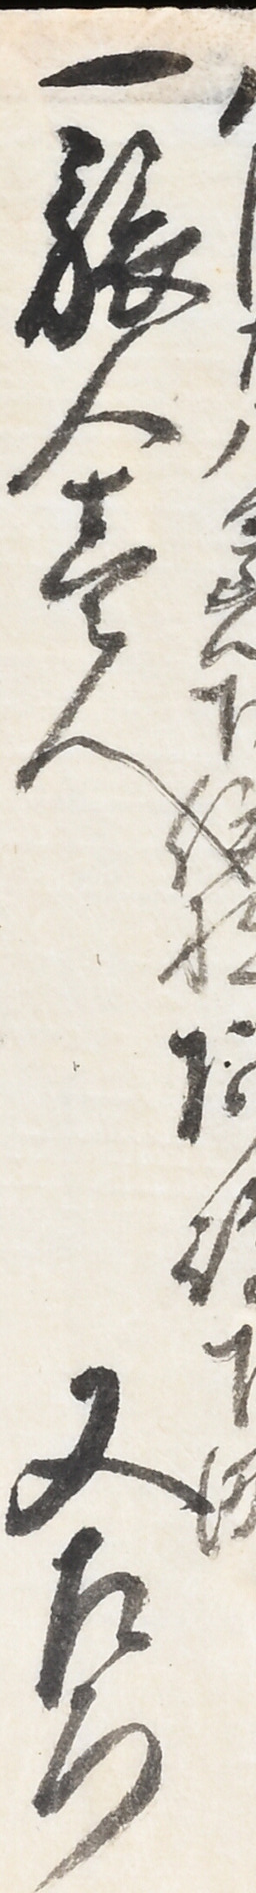一旅人壱人又左衛門
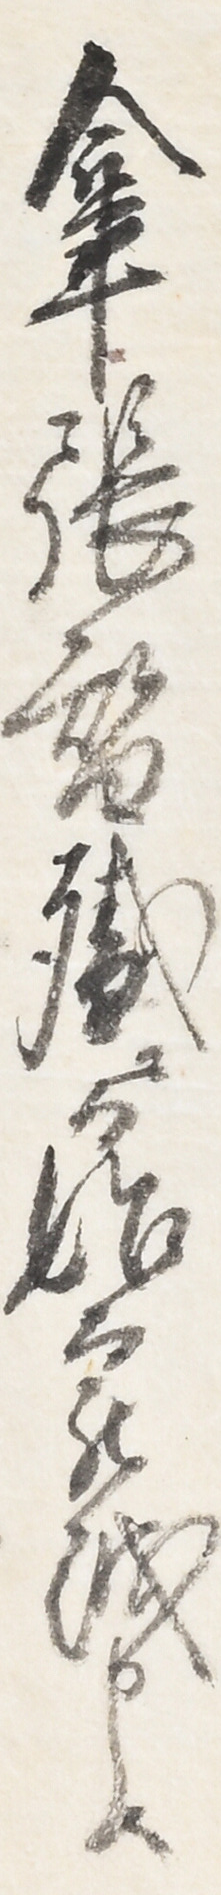笠張替職ニ而始而罷越申候
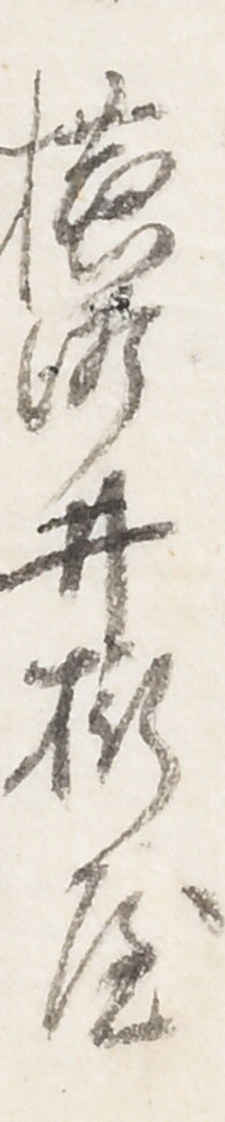横町井桁屋
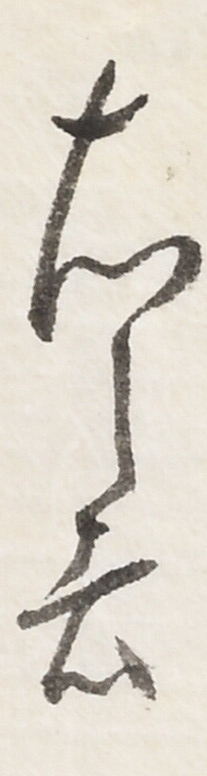右之者
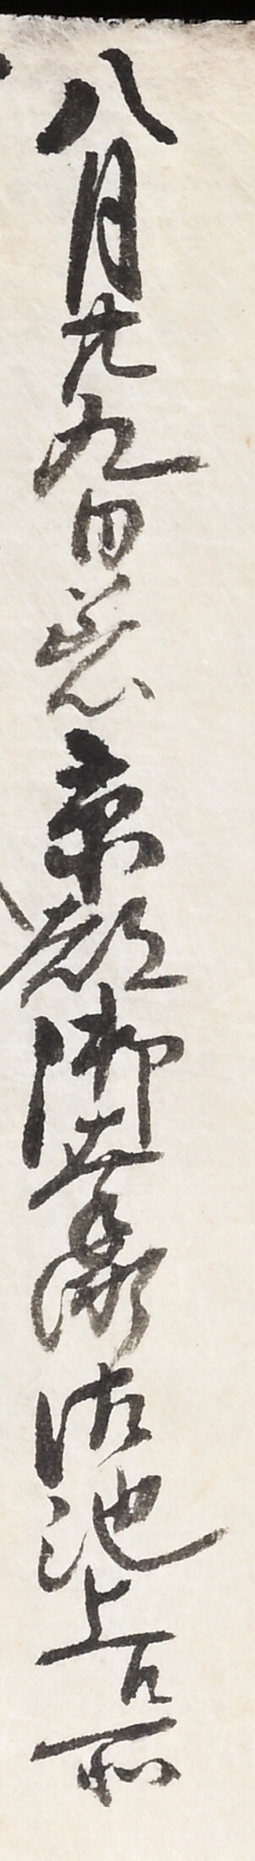八月廿九日着京都御幸町御池上ル所
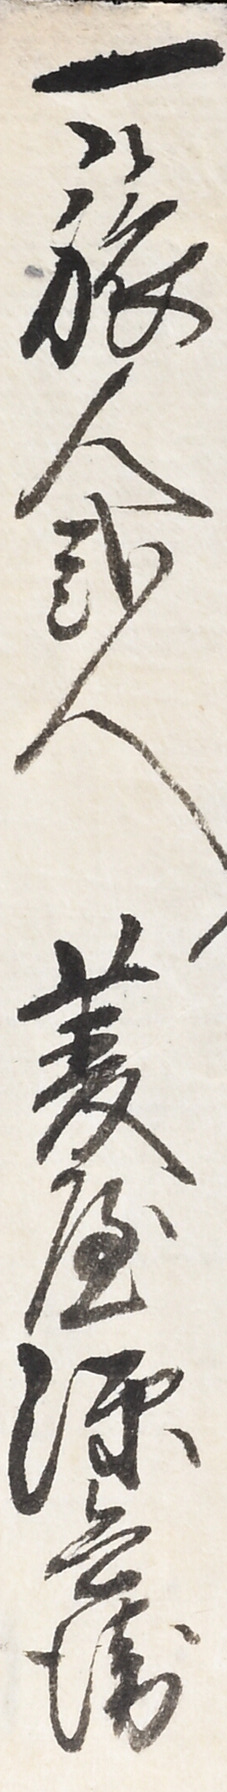一旅人弐人菱屋源兵衛
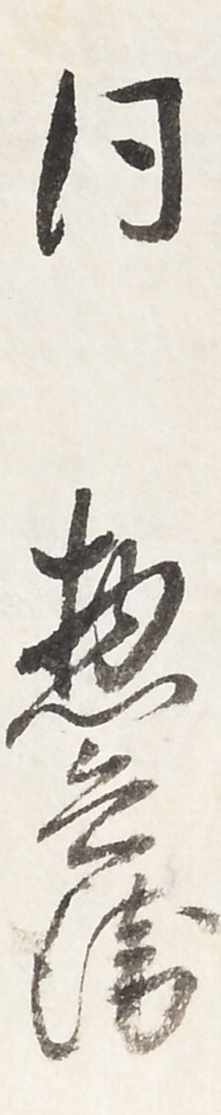同惣兵衛
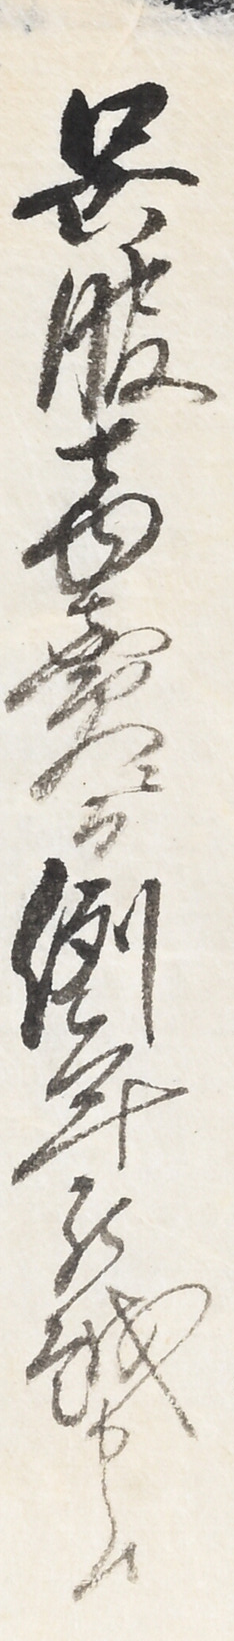呉服商売ニ而例年罷越申候
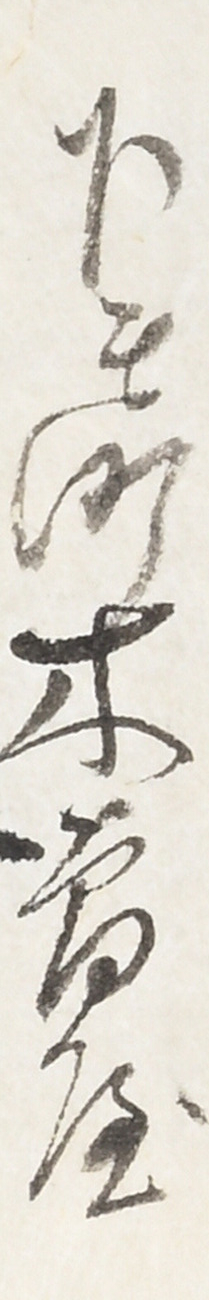下モ町木曽屋
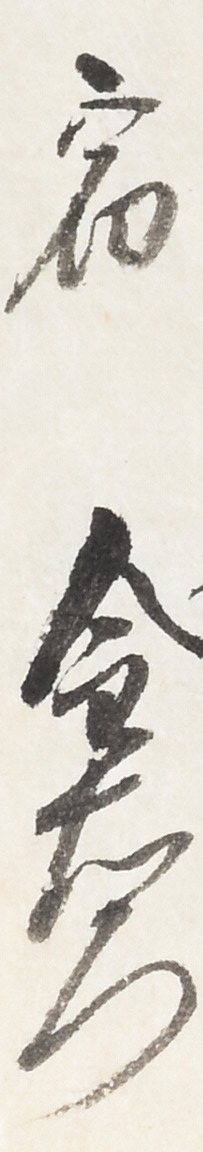宿金右衛門
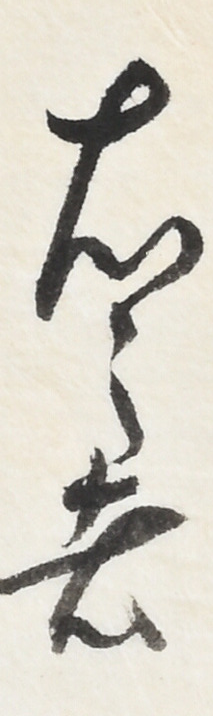右之者
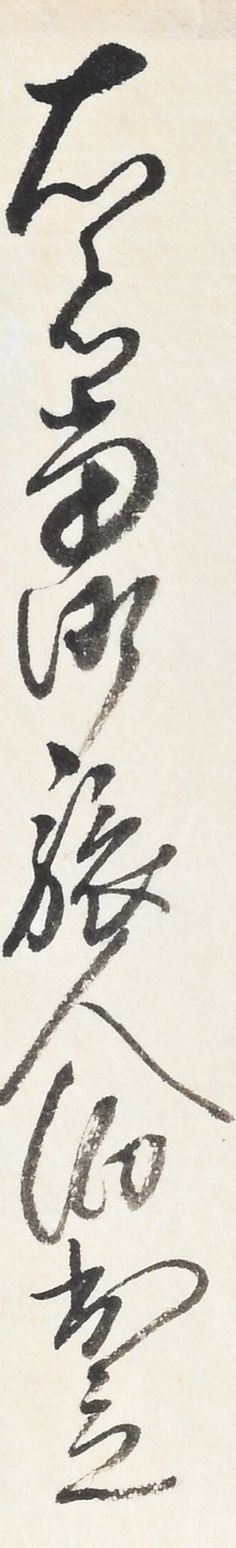右者当町旅人泊出立
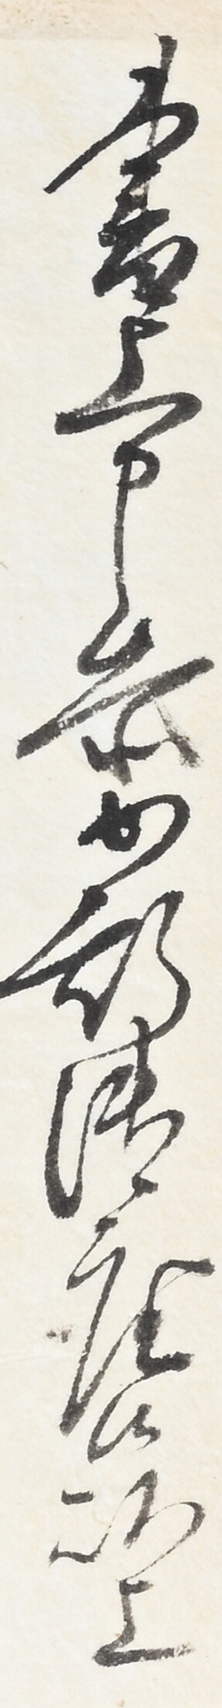書上申候所如斯御座候以上
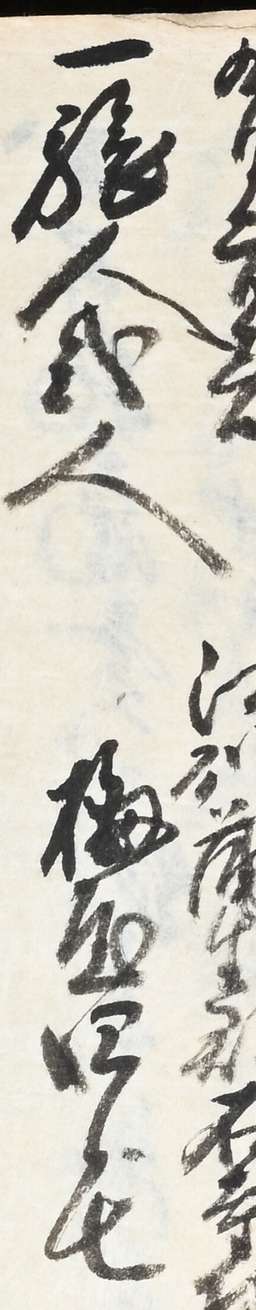一旅人弐人菱屋源兵衛

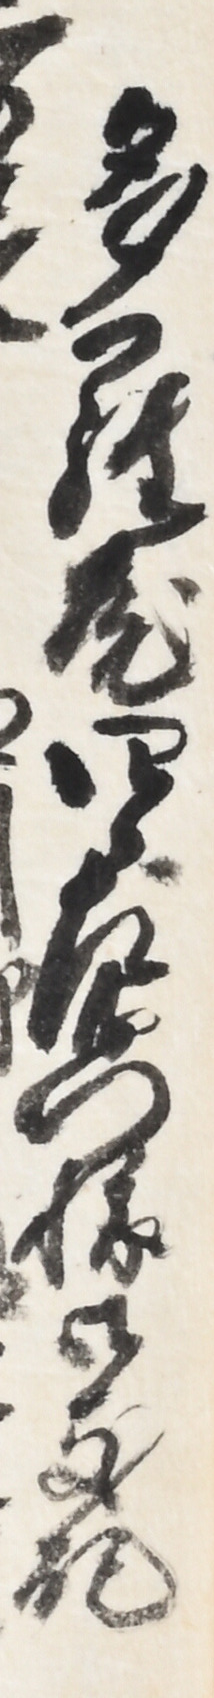多羅尾四郎左衛門様御支配
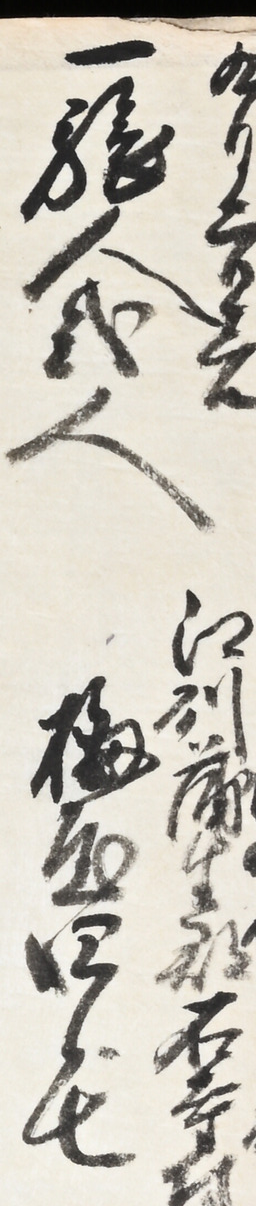一旅人弐人梅屋四郎七
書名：旅人泊控帳
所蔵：伊那市立高遠町図書館・合同会社AMANE
